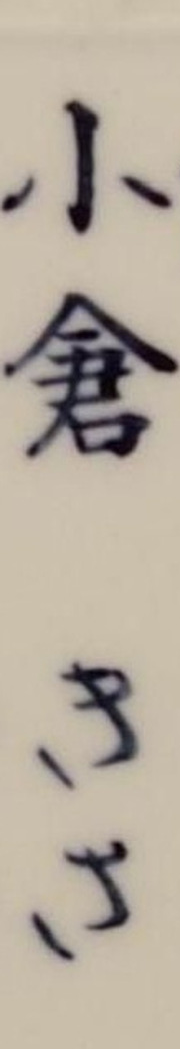小倉きさ
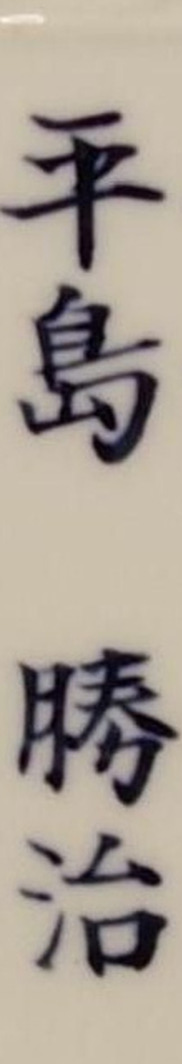平島勝治
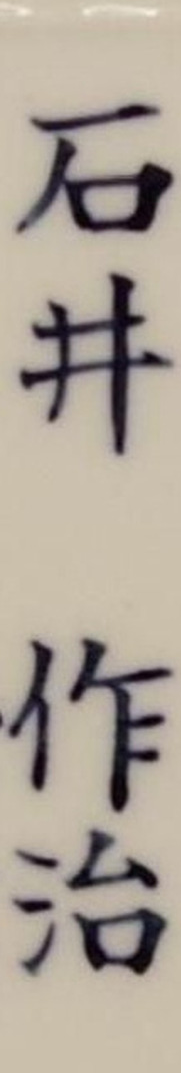石井作治
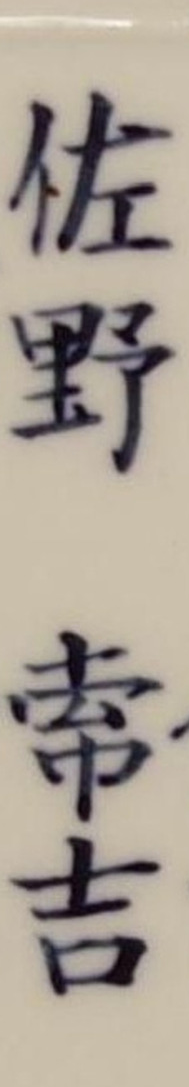佐野常吉
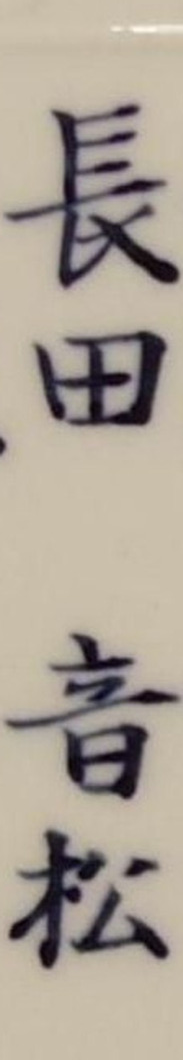長田音松
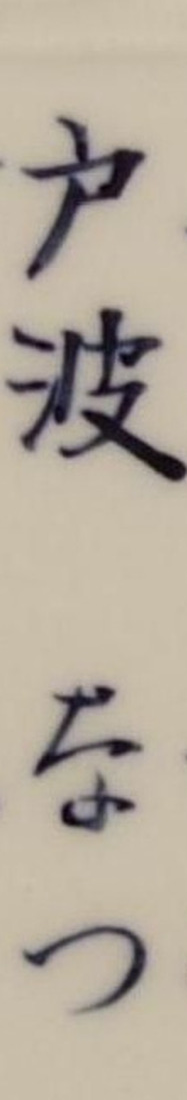戸波なつ
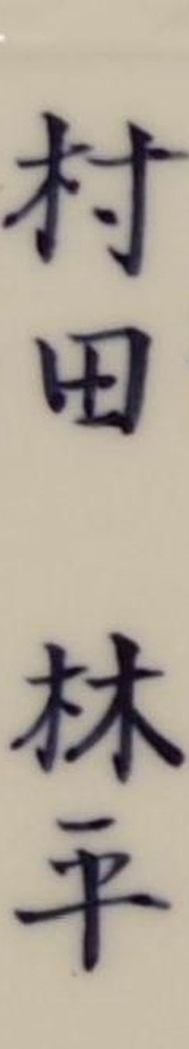村田林平
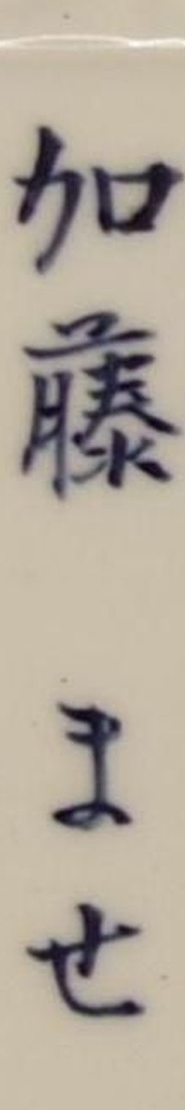加藤ませ

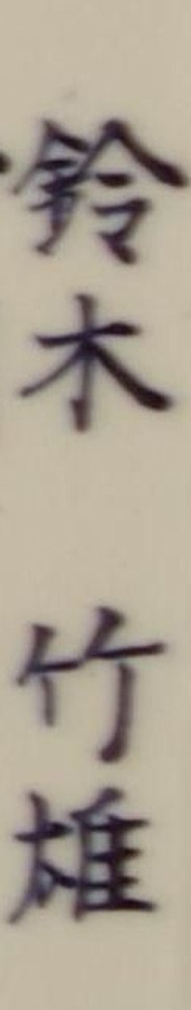鈴木竹雄
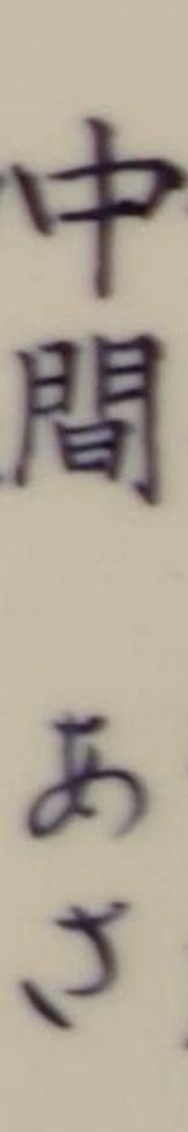中間あさ
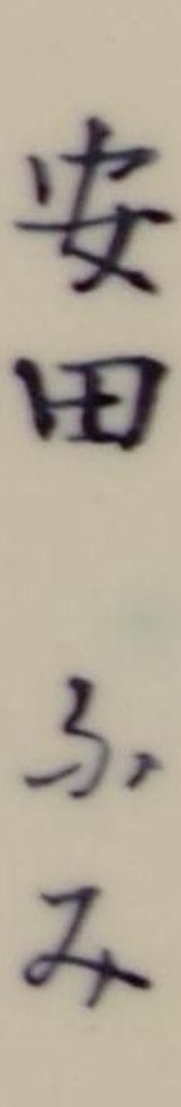安田ふみ
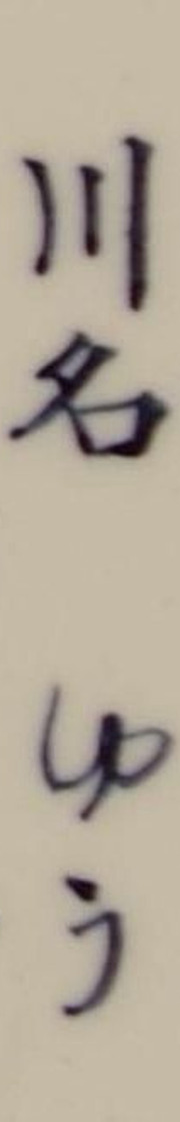川名ゆう
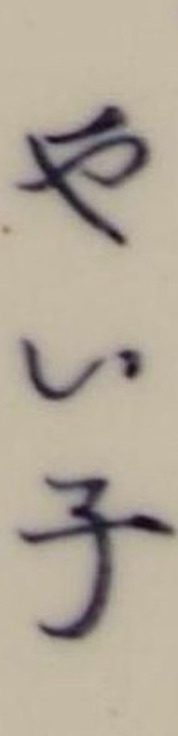やい子
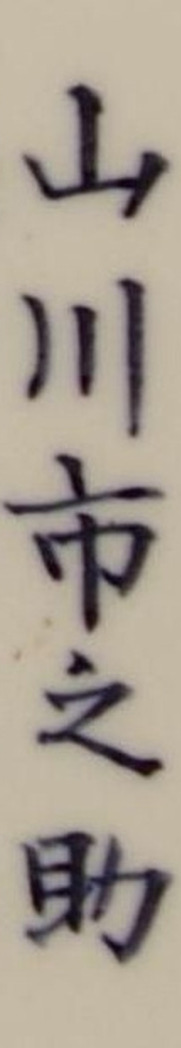山川市之助
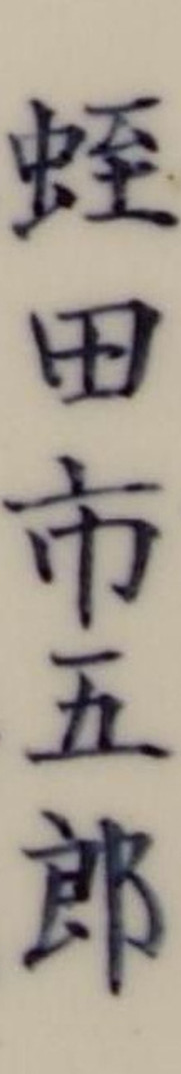蛭田市五郎
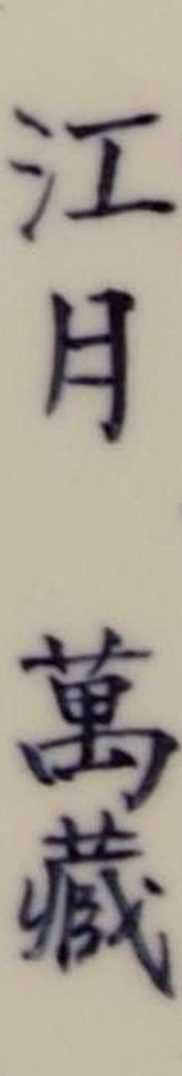江月萬蔵
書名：M~S
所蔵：高野山金剛峯寺
